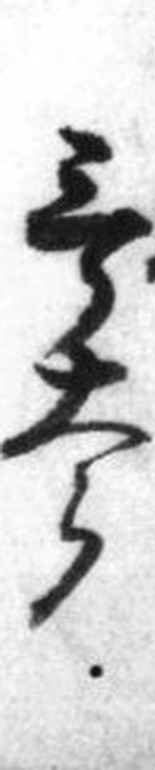三郎太郎
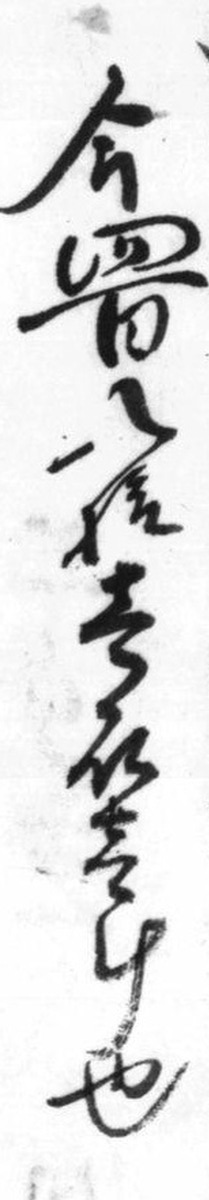合四百八拾壱石壱斗也
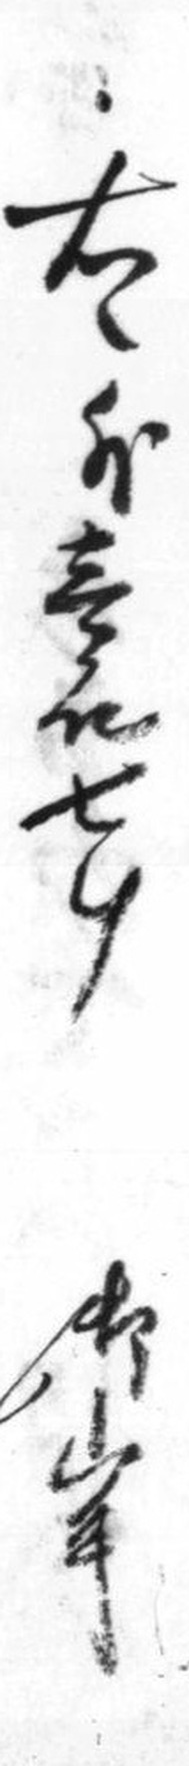右之外壱石七斗御山手
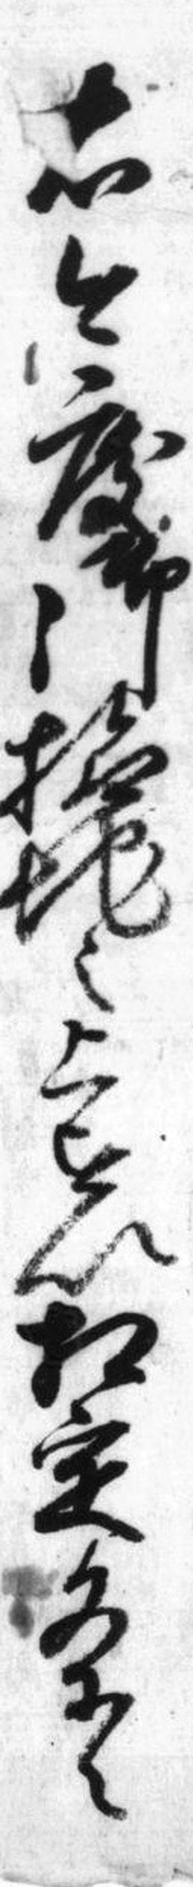右今度御検地之上を以相定条々
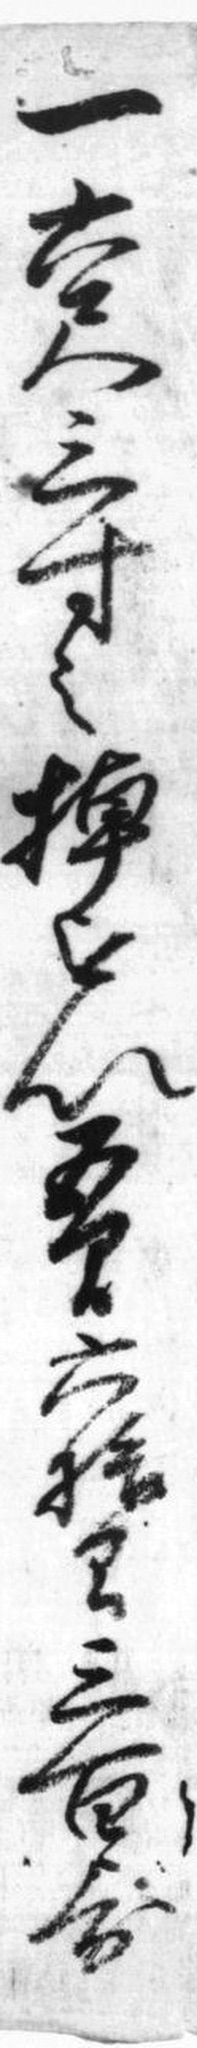一六尺三寸之棹を以五間六拾間三百歩
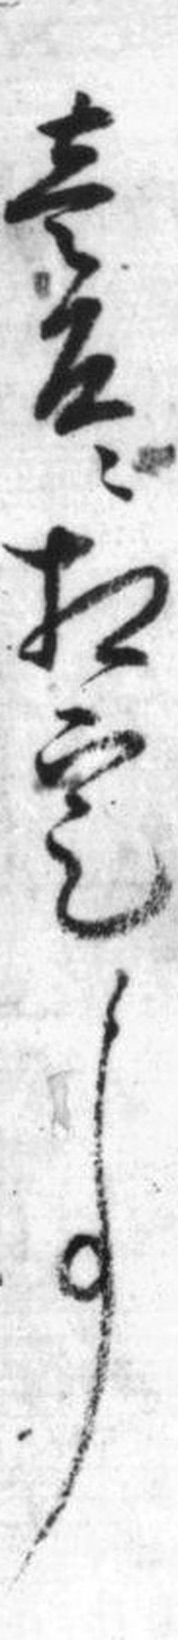壱反二相定候事
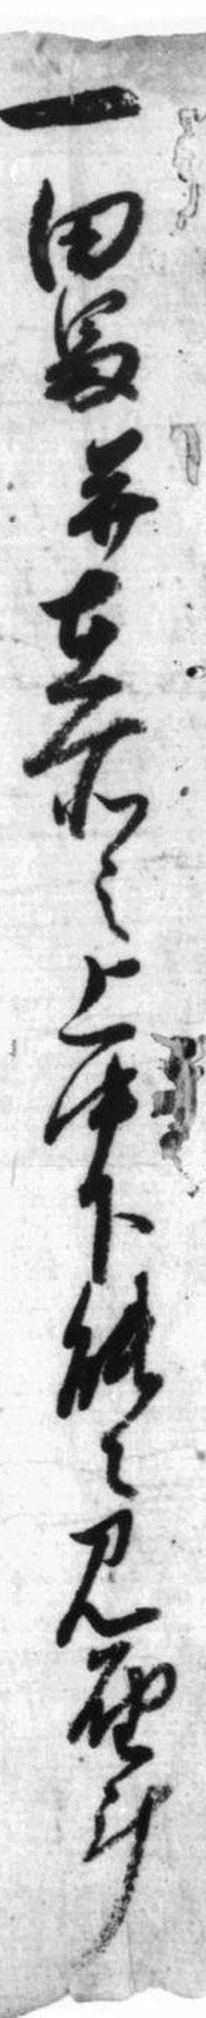一田畠并在所之上中下能々見届計
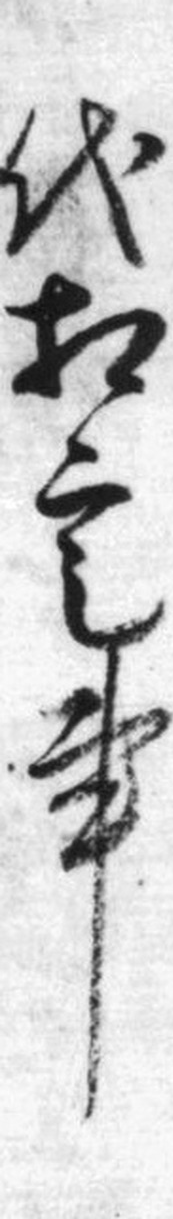代相定事
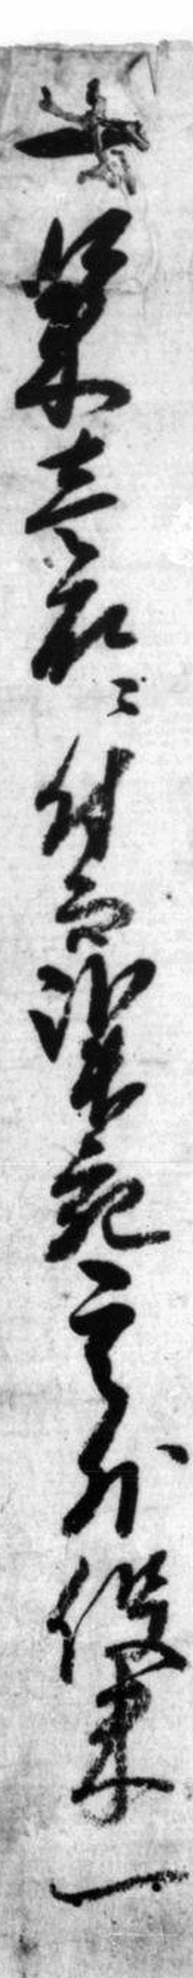一口米壱石二付而弐升宛其外役米一

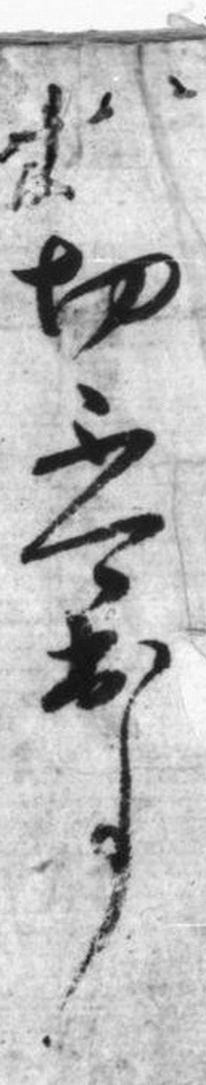切不可出事
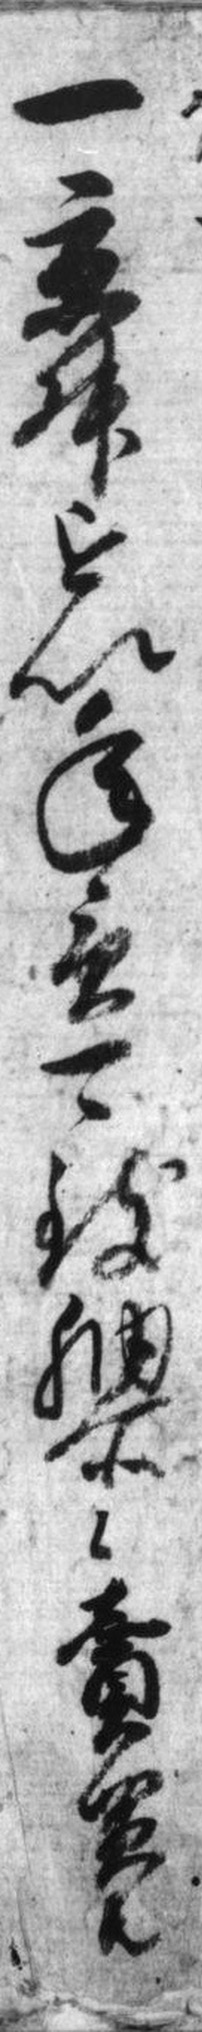一京升を以年貢可致納所二売買共
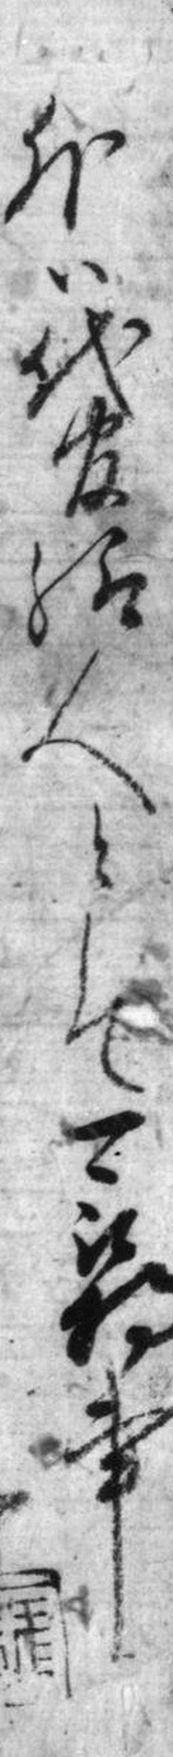外ハ代官給人として可被持事
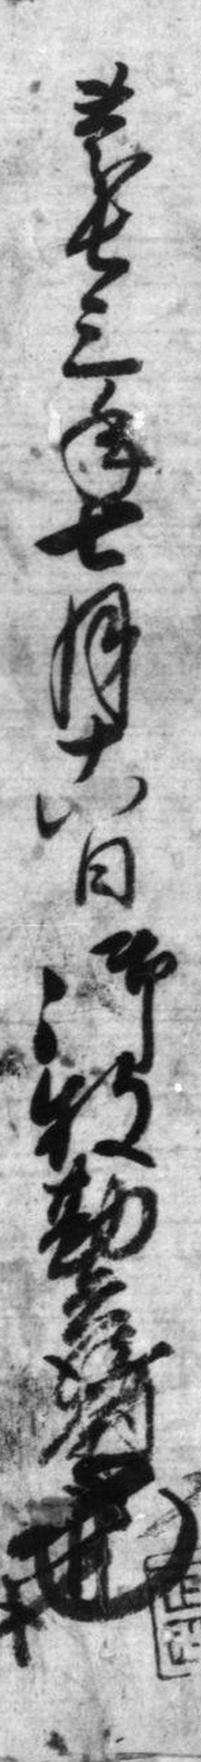慶長三年七月十八御牧勘兵衛尉花押

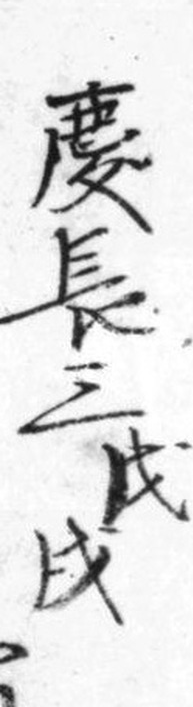慶長三戌戌
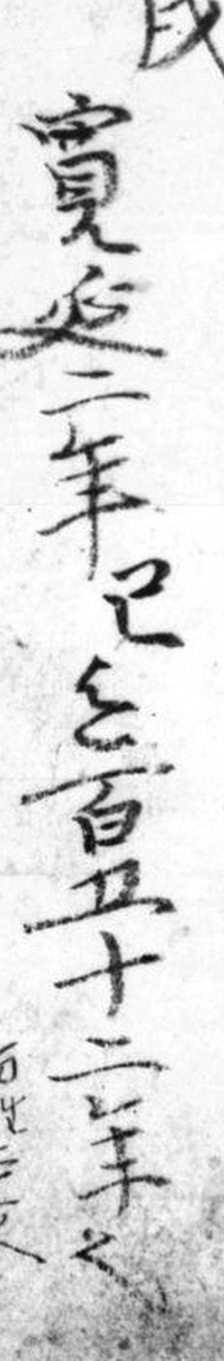寛延二年百己巳五十二年也
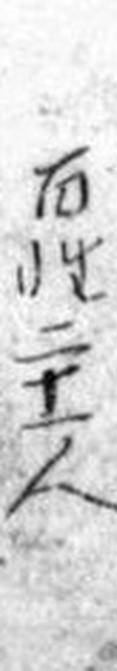百性二十一人
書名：越前国大野郡今井村御検地帳
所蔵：福井県文書館 Fukui Prefectural Archives
